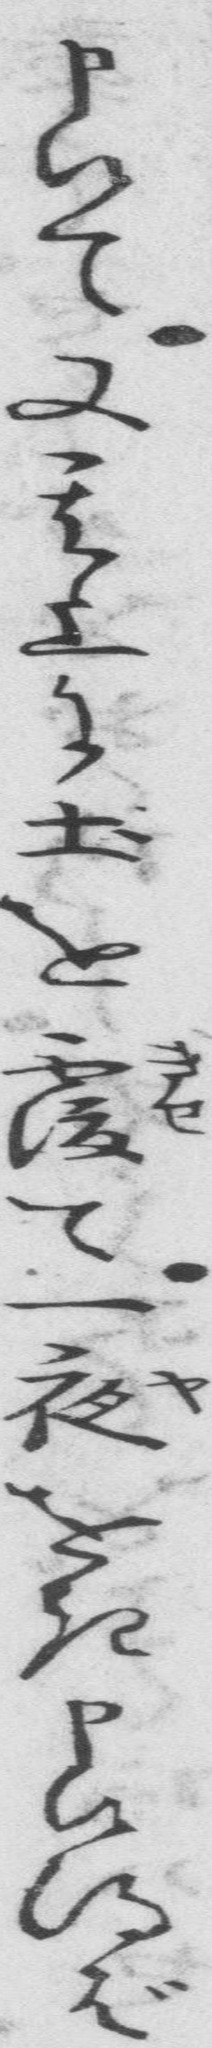申候て。又其上に土を覆て。一夜をき申候得ば
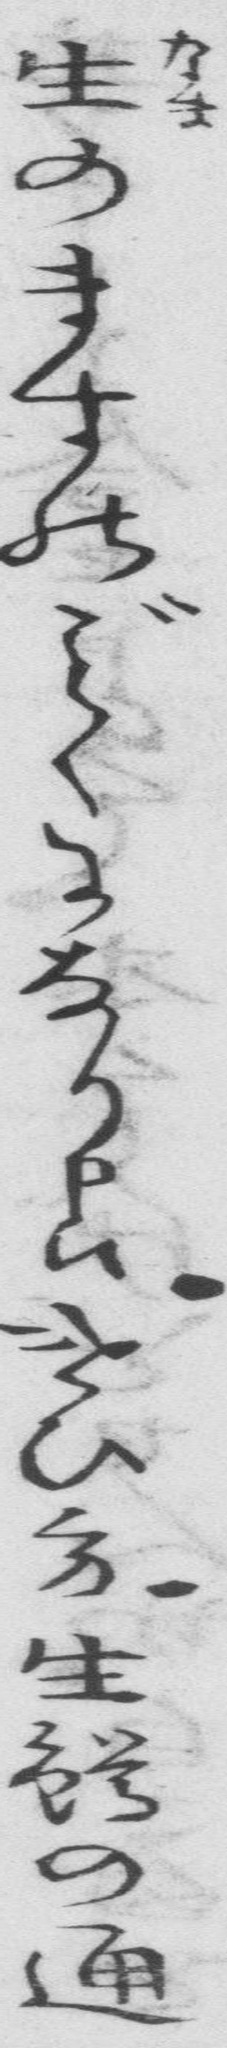生のますのごとくになり申候。遣ひ方。生鱒の通
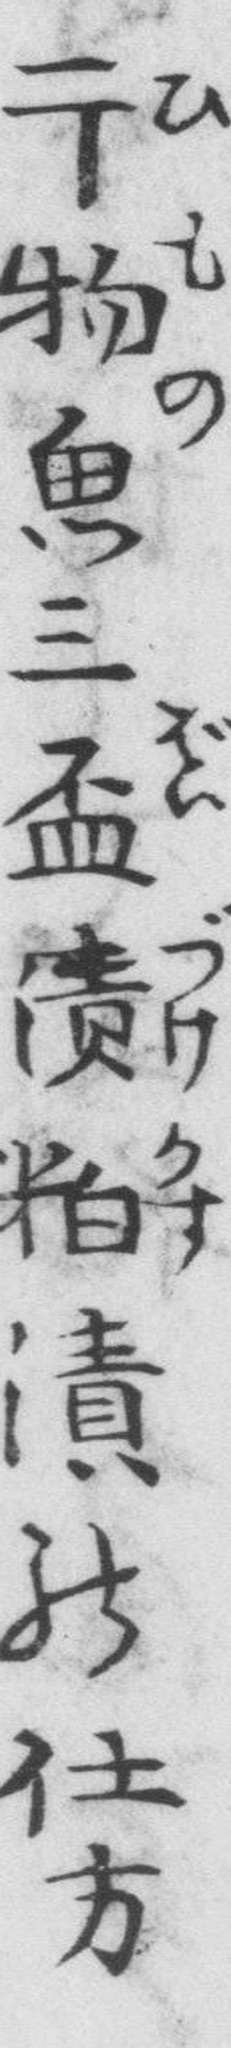干物魚三盃漬粕漬の仕方
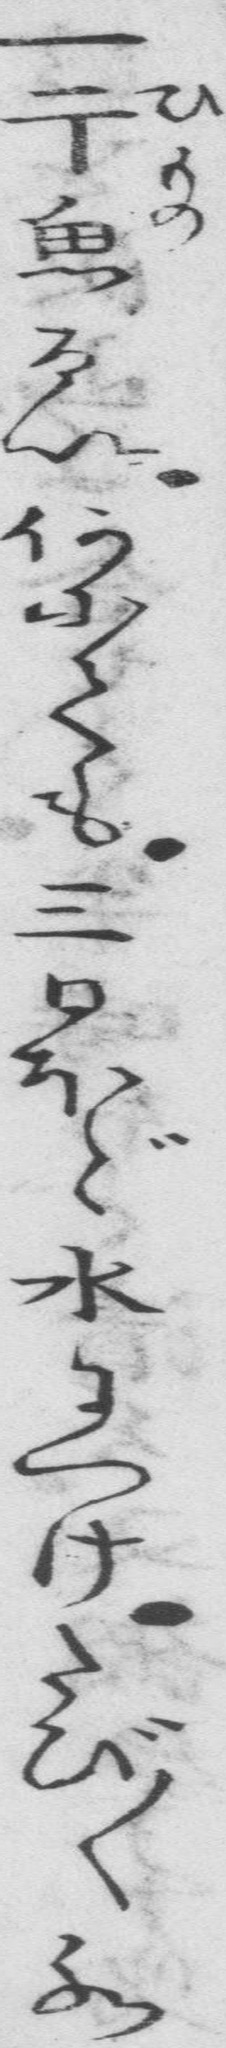一干魚るい。何にても。三日ほど水につけ。たび〳〵水
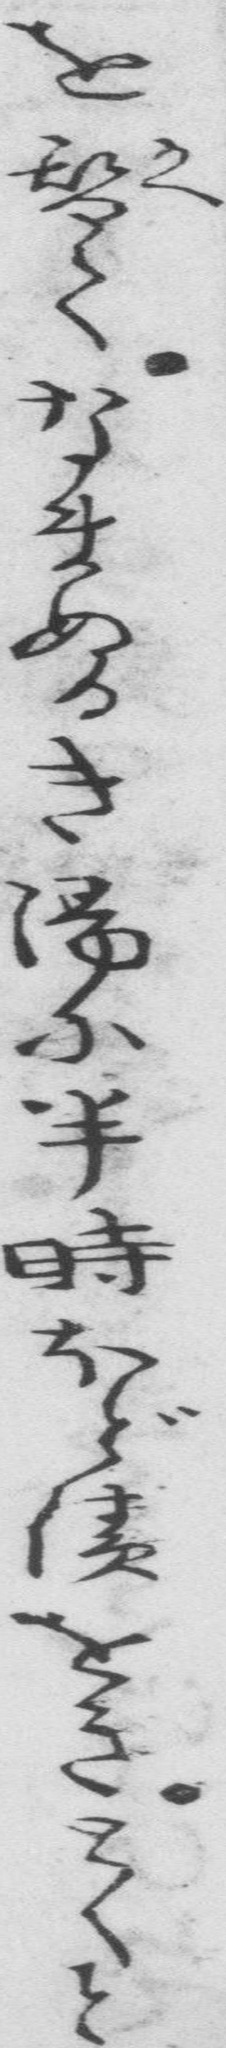を替て。なまぬるき湯に半時ほど漬をき。とくと
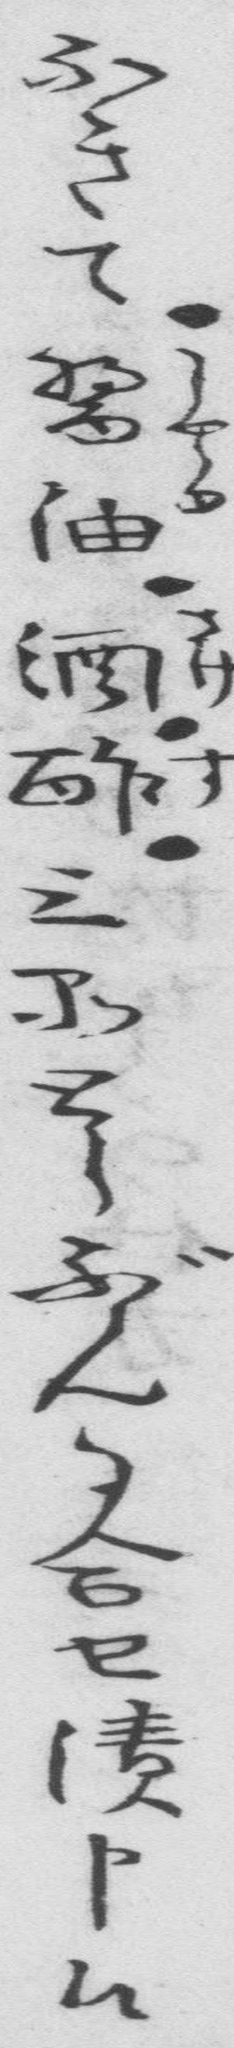ふきて。醤油。酒。酢。三品とうぶんに合せ漬申候
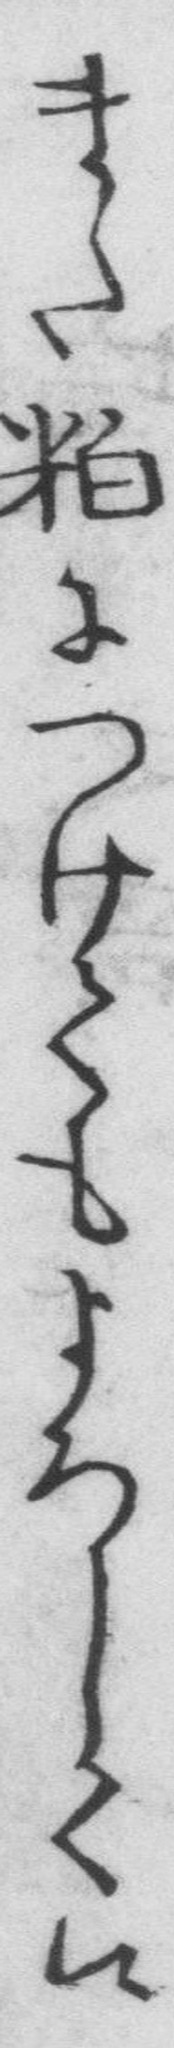また粕につけてもよろしく候

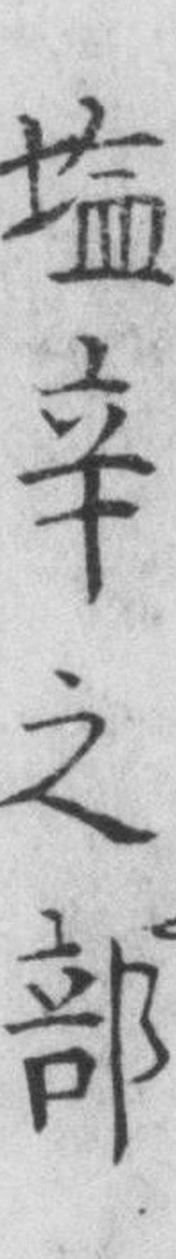塩辛之部
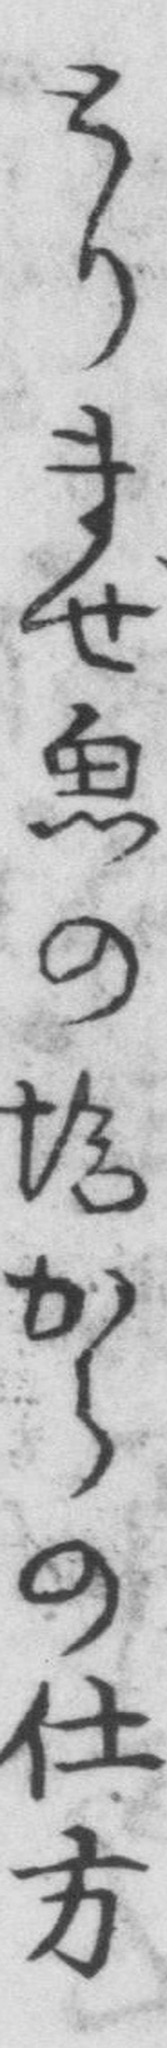とりまぜ魚の塩からの仕方
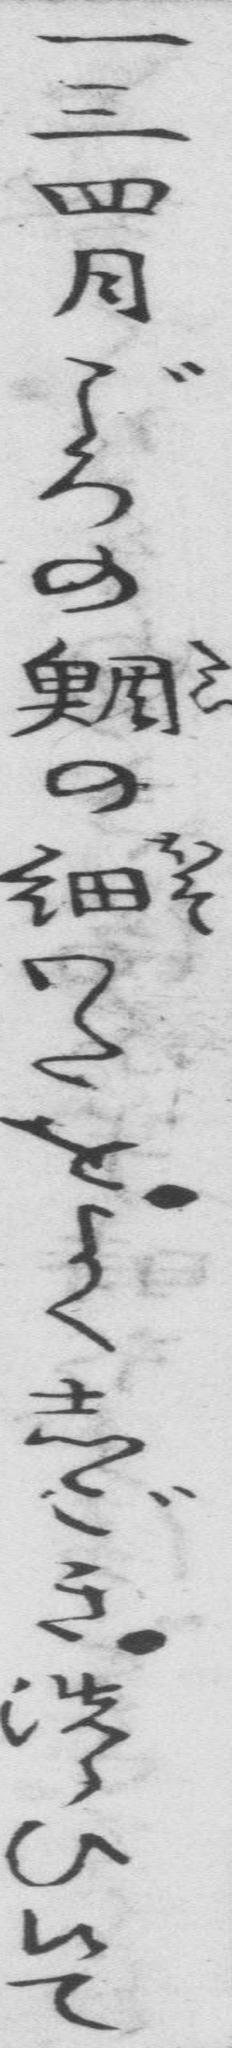一三四月ごろの鯛の細わたを。よくしごき。洗らひ候て
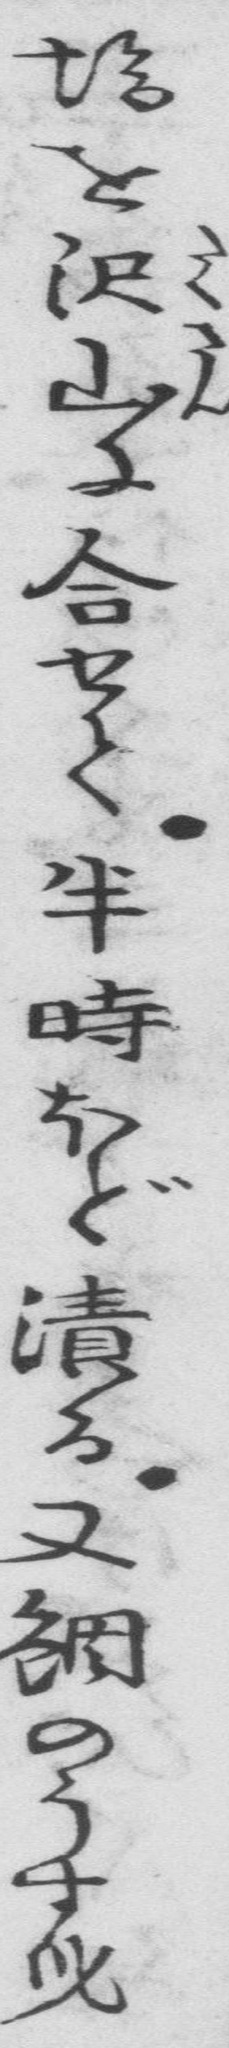塩を沢山に合せて。半時ほど漬る。又鯛のうす身
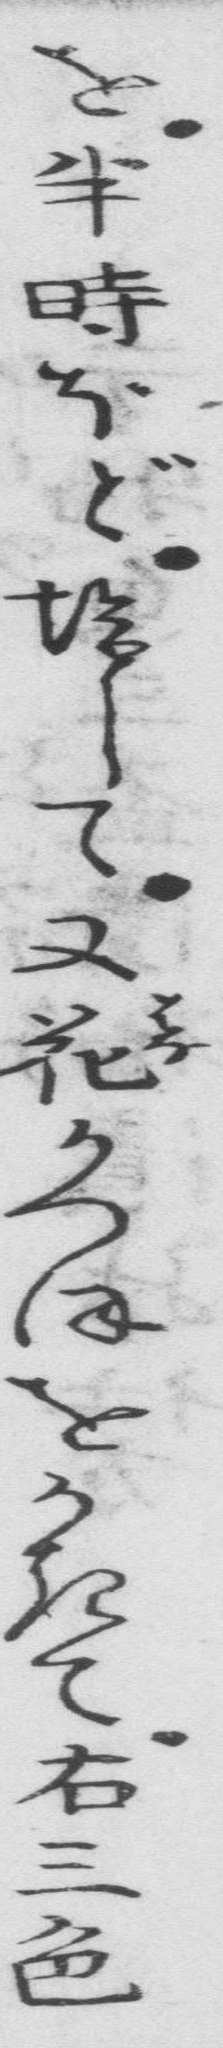を。半時ほど。塩して。又花かつほをかきて。右三色
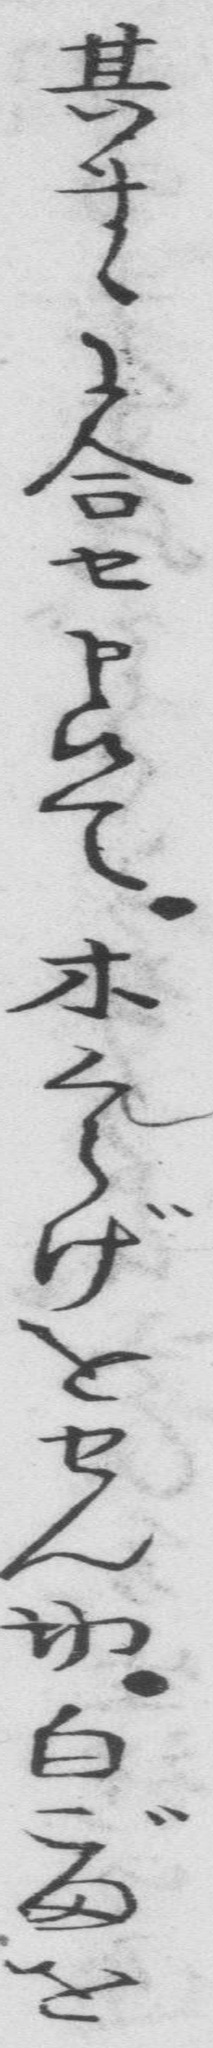其まゝに合せ申候て。木くらげをせん切。白ごまを
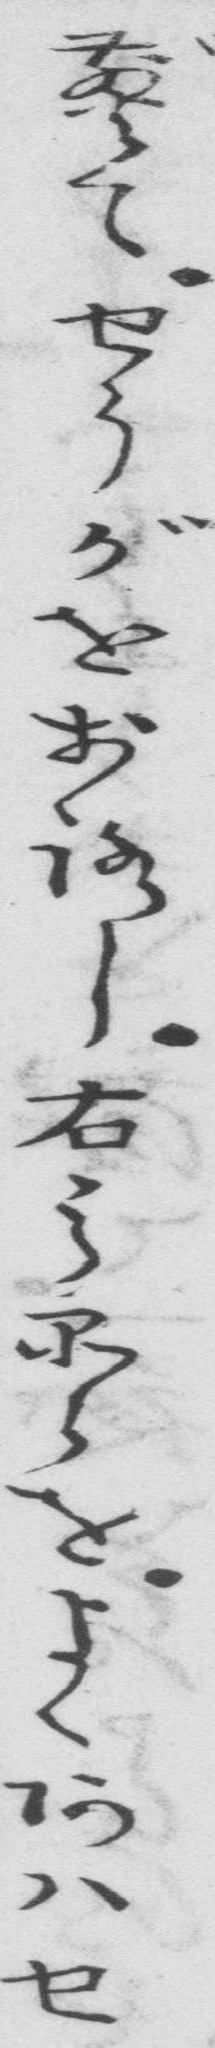煎て。せうがをおろし。右之品々を。よくあはせ
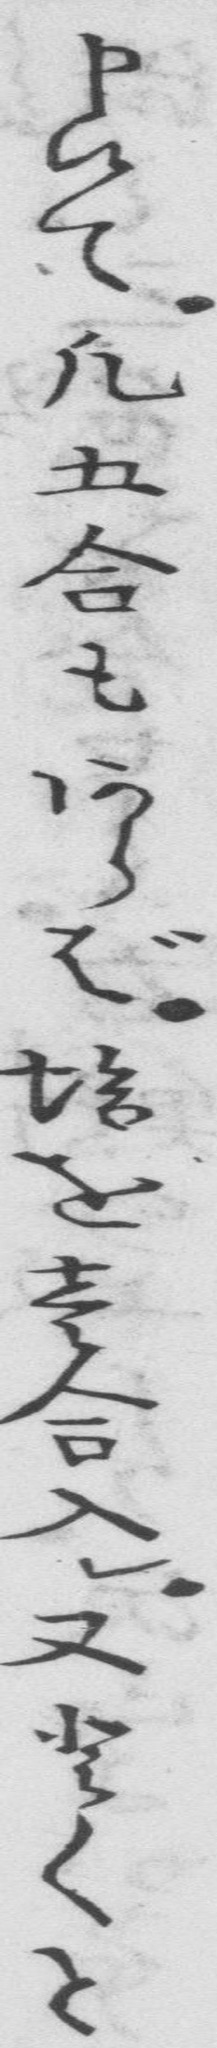申候て。凡五合もあらば。塩を壱合入れ。又とくと
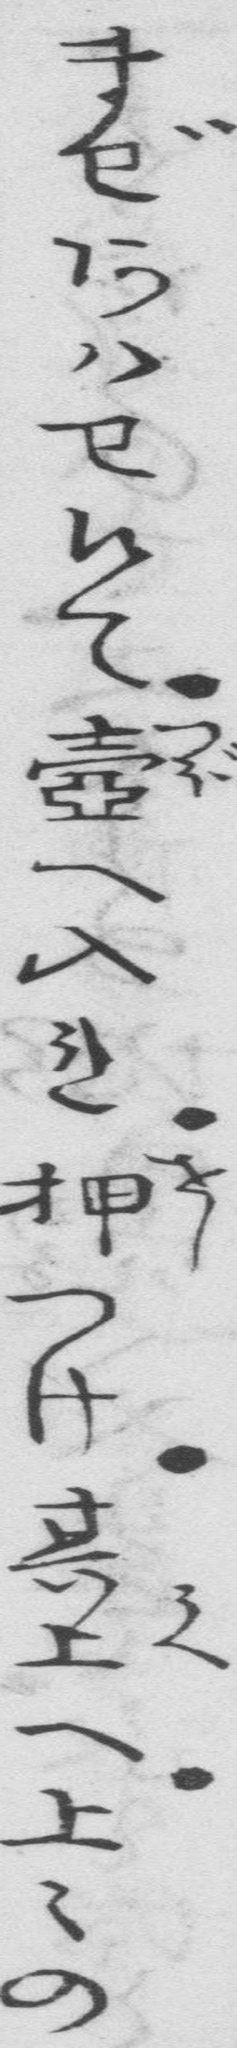まぜあはせ候て。壺へ入れ。押つけ。其上へ。上々の
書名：萬寳料理秘密箱
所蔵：大阪府立大学学術情報センター 国文学研究資料館
